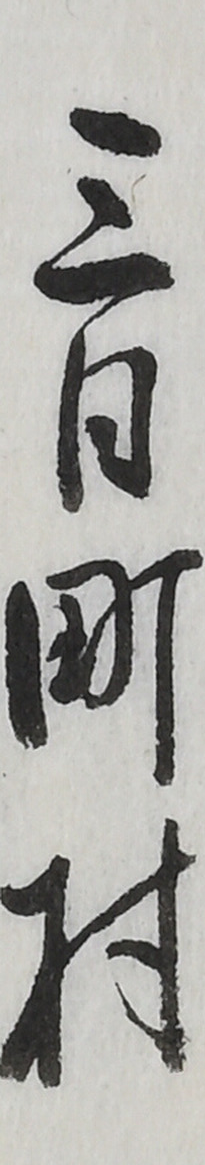三日町村
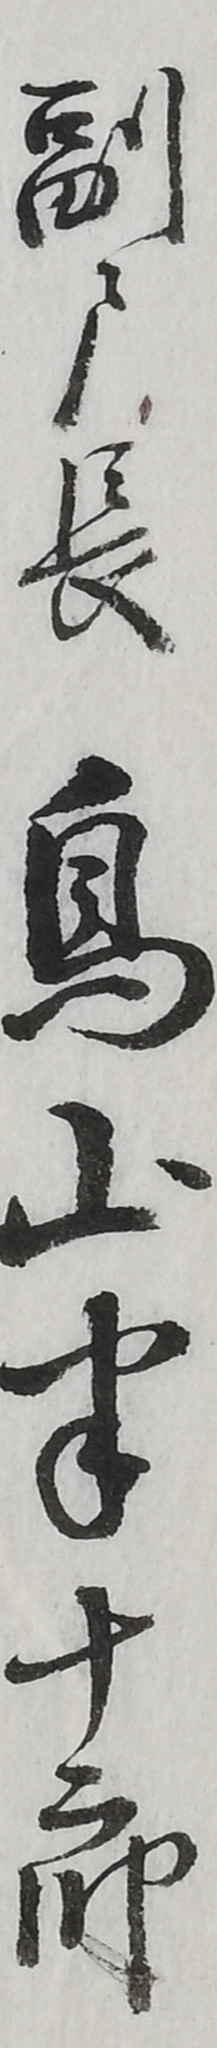副戸長鳥山半十郎
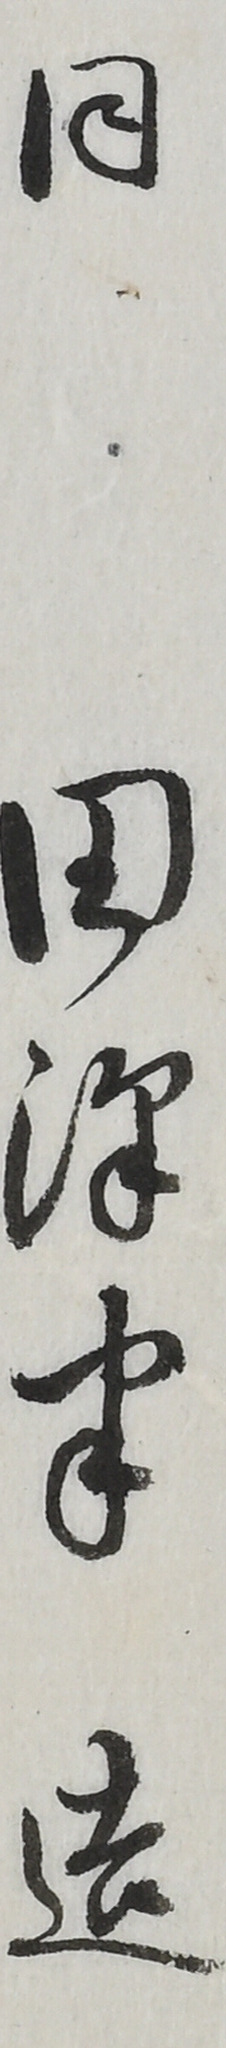同田澤半造
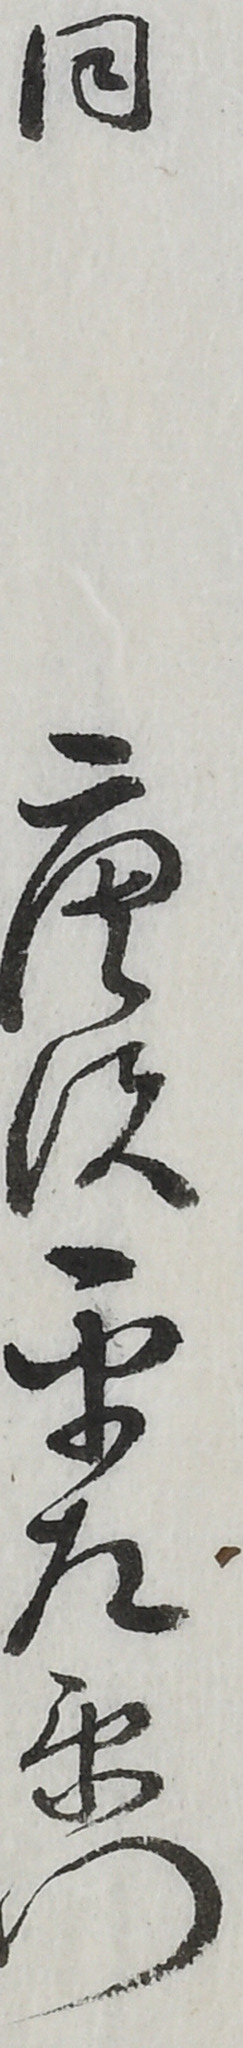同唐沢平左衛門
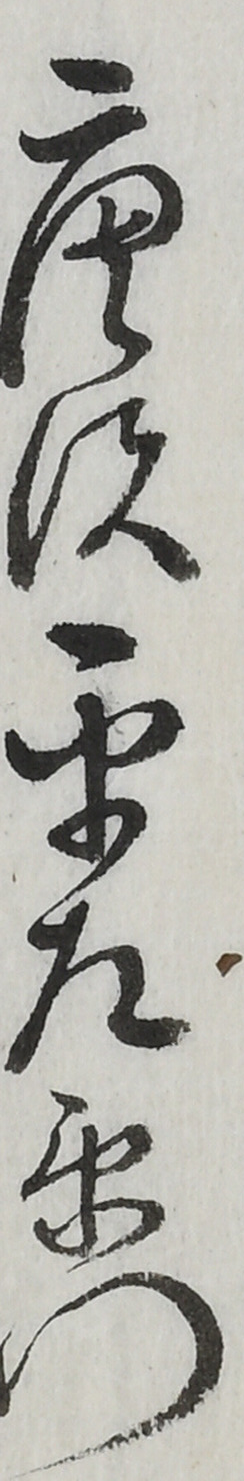同唐沢平左衛門
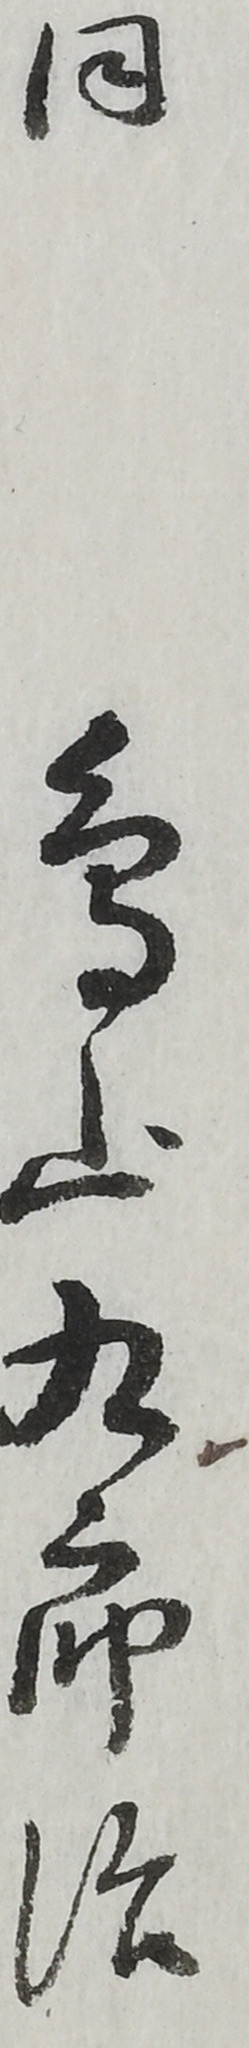同鳥山九郎治
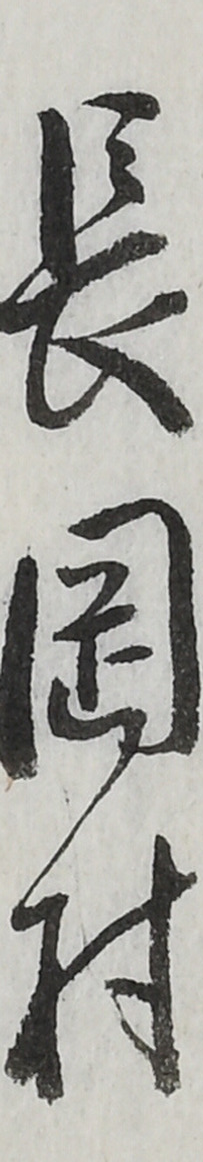長岡村

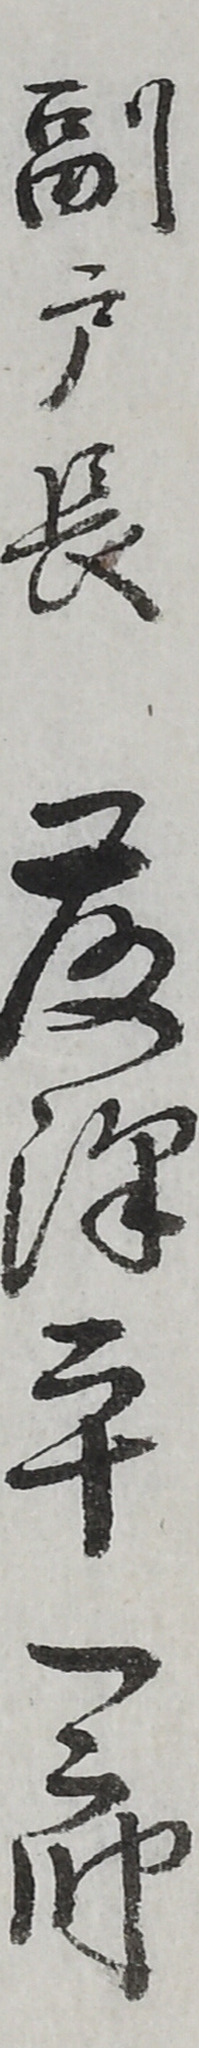副戸長藤澤平一郎
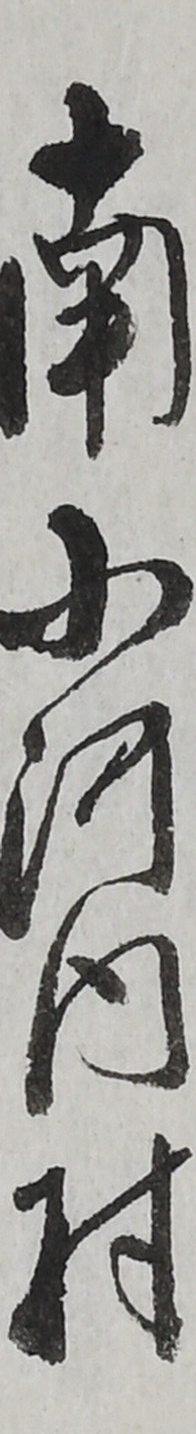南北河内村
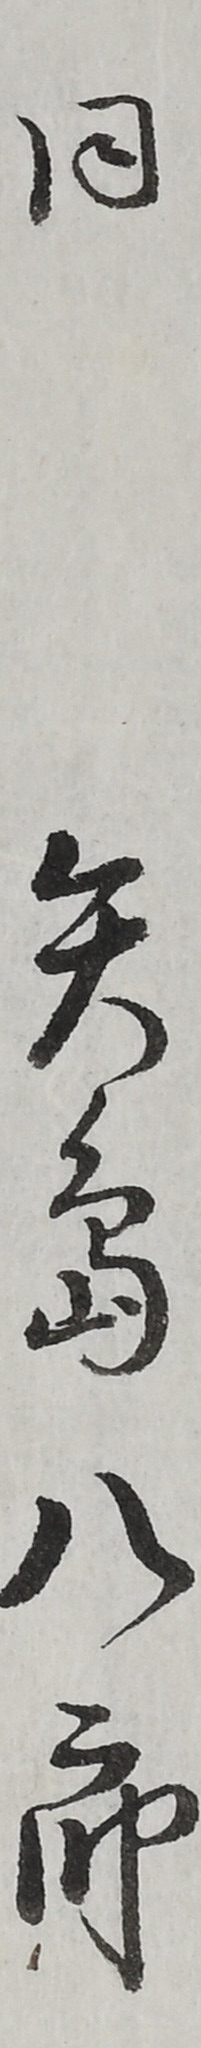同矢島八郎
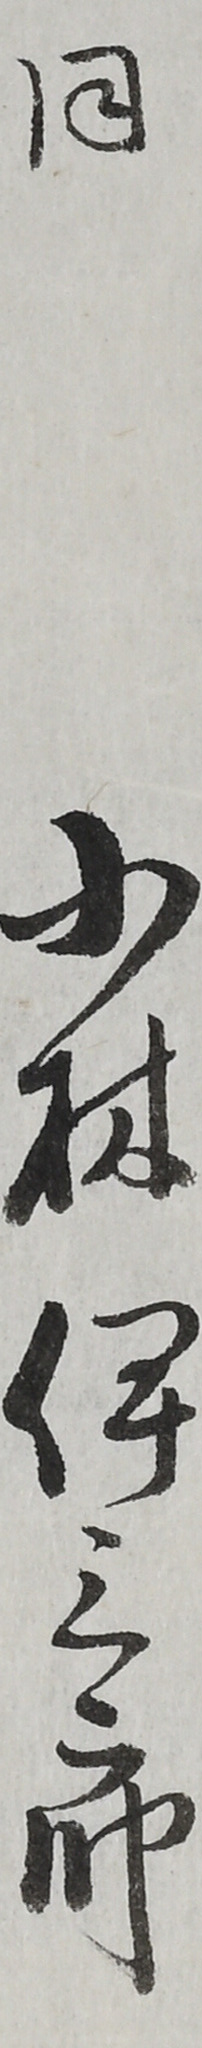同小林伊三郎
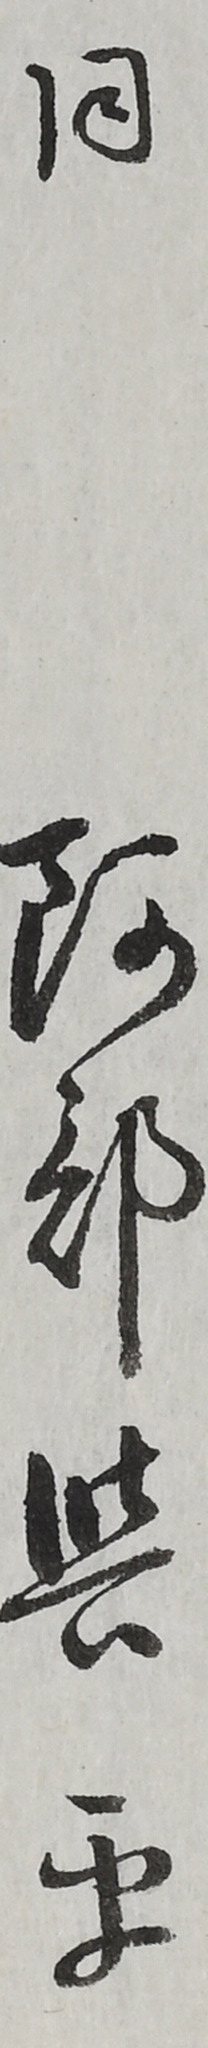同阿部与平
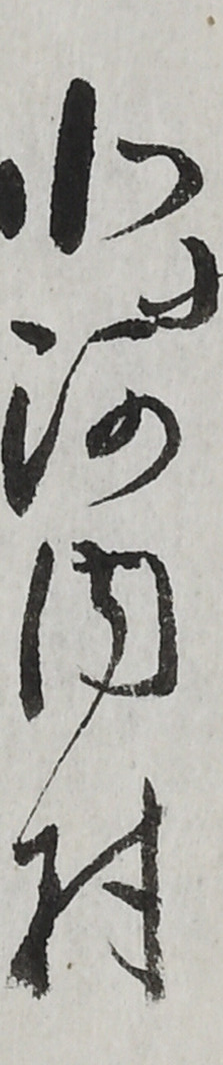北河内村
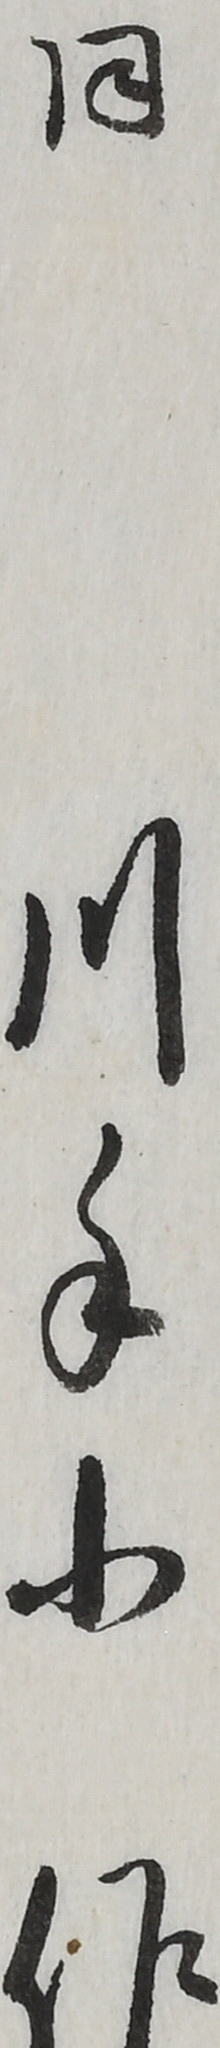同川手小作
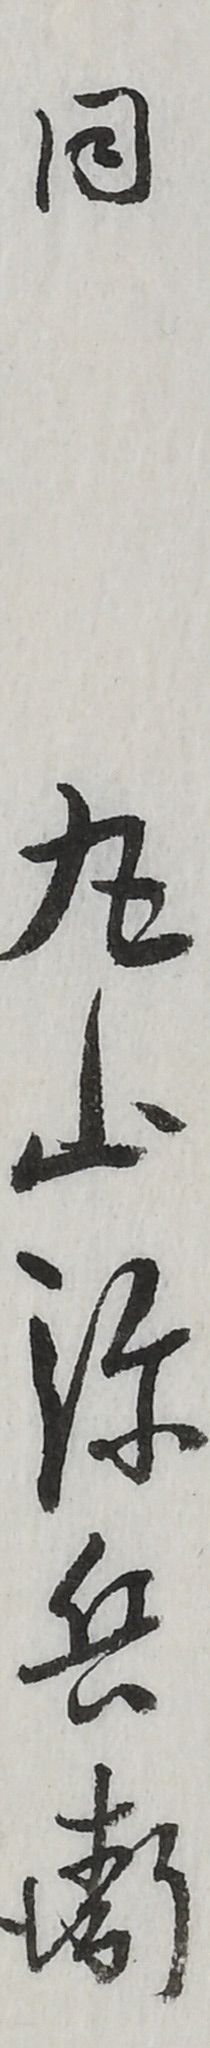同丸山弥兵衛
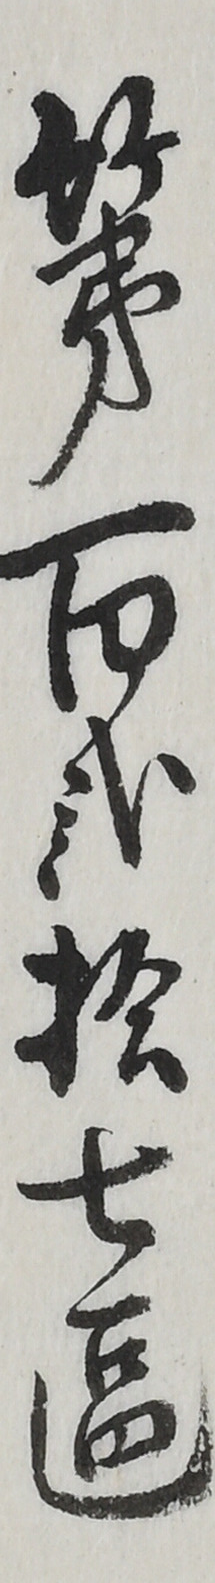第百弐拾七区
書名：伊那郡毎村戸長副戸長名簿
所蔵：伊那市立高遠町図書館・合同会社AMANE
